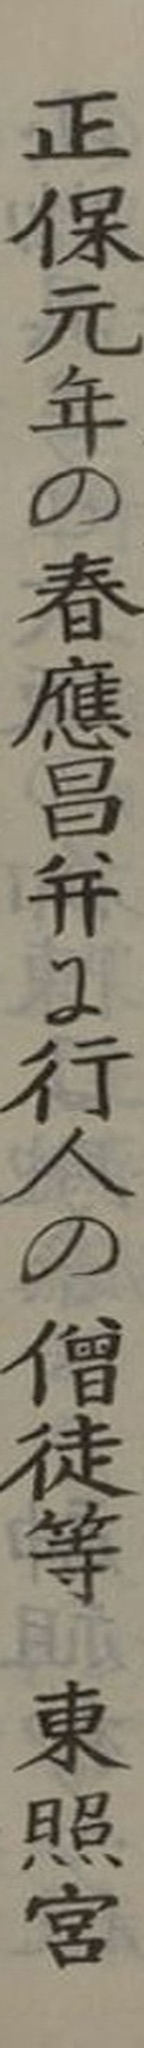正保元年の春應昌并に行人の僧徒等東照宮
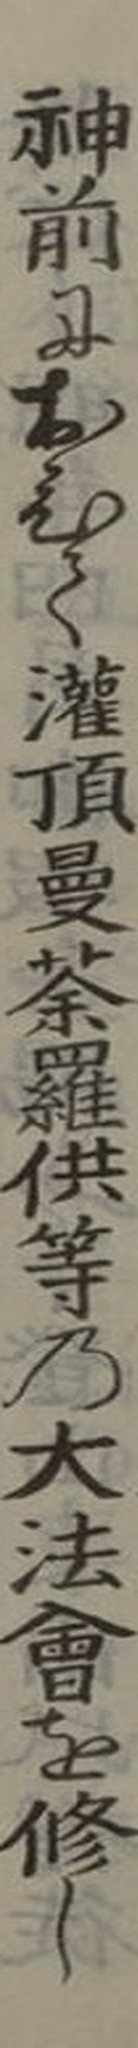神前におひて灌頂曼荼羅供等の大法會を修し
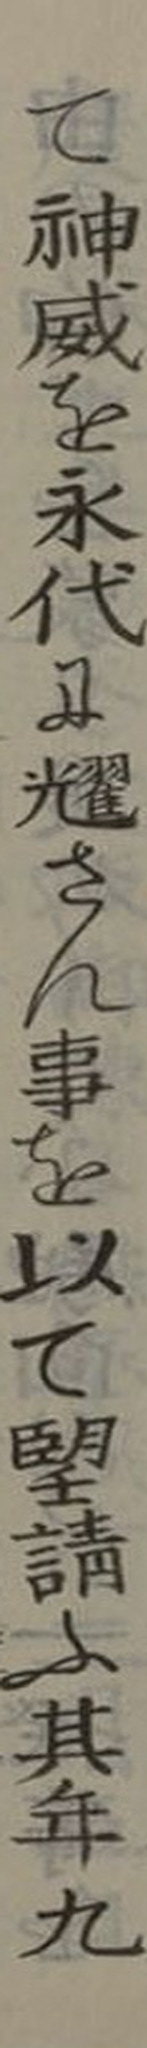て神威を永代に耀さん事を以て朢請ふ其年九
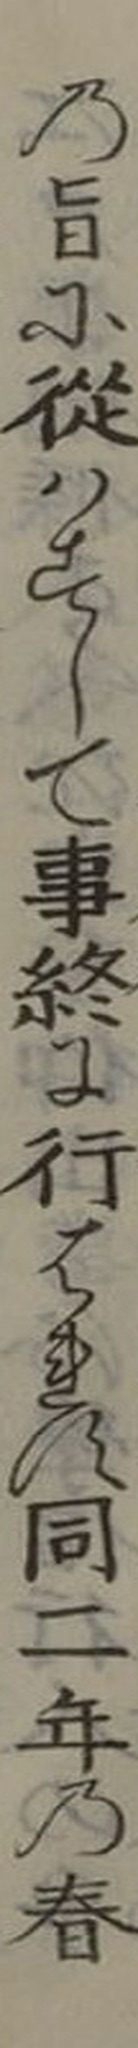の旨に從はすして事終に行はれす同二年の春
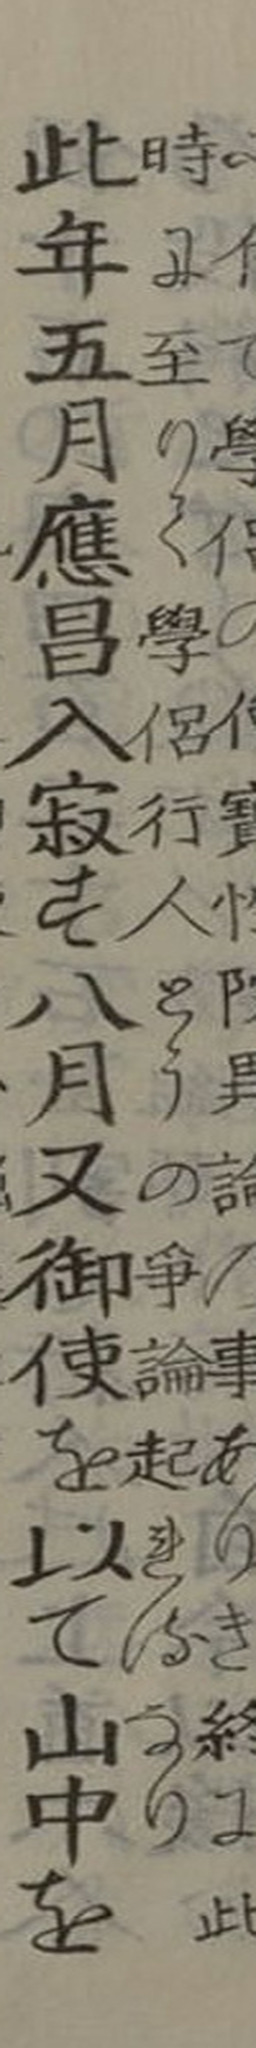此年五月應昌入寂す八月又御使を以て山中を
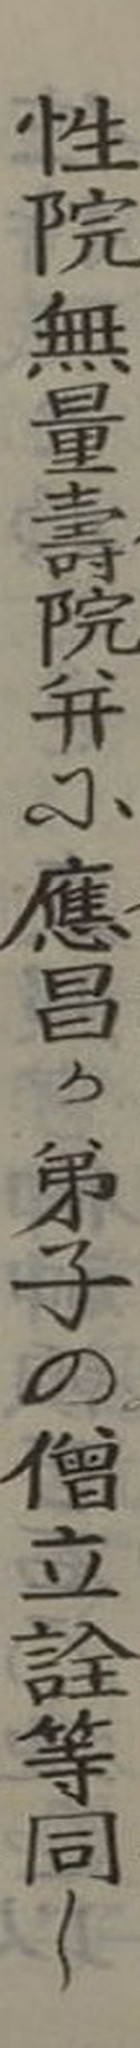性院無量壽院并に應昌か弟子の僧立詮等同し
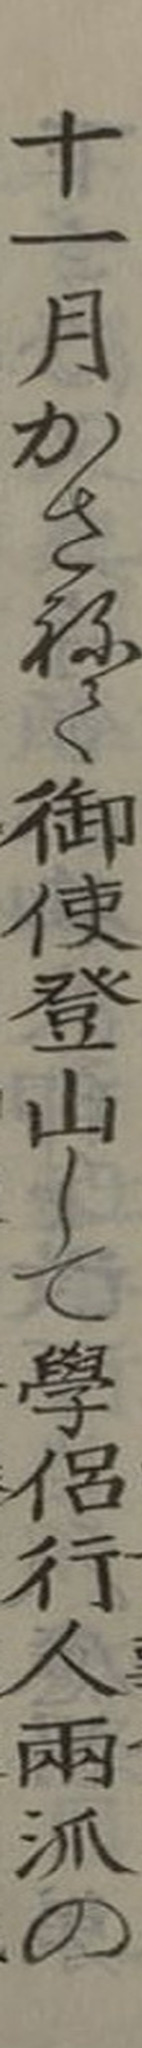十一月かさねて御使登山して學侶行人兩派の

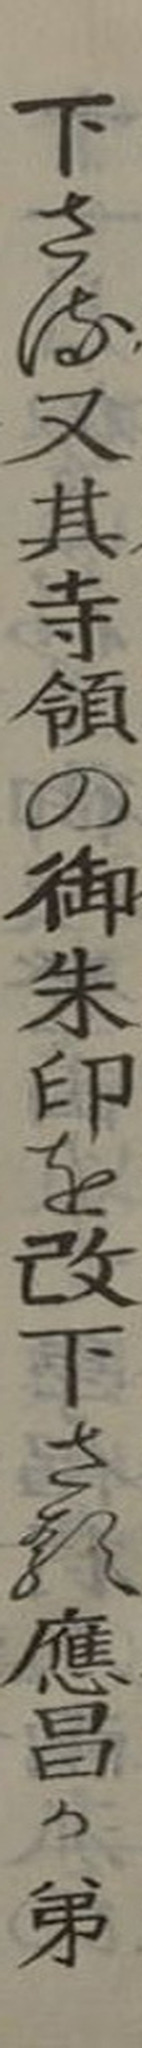下さる又其寺領の御朱印を改下さる應昌の弟
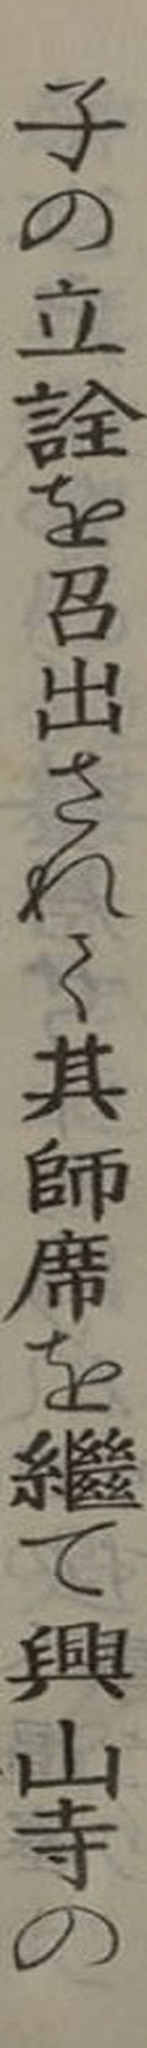子の立詮を召出されて其師席を繼て興山寺の
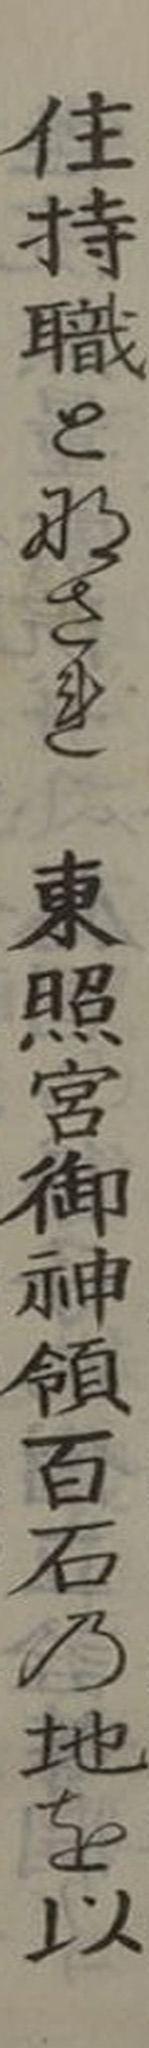住持職をなされ東照宮御神領百石の地を以
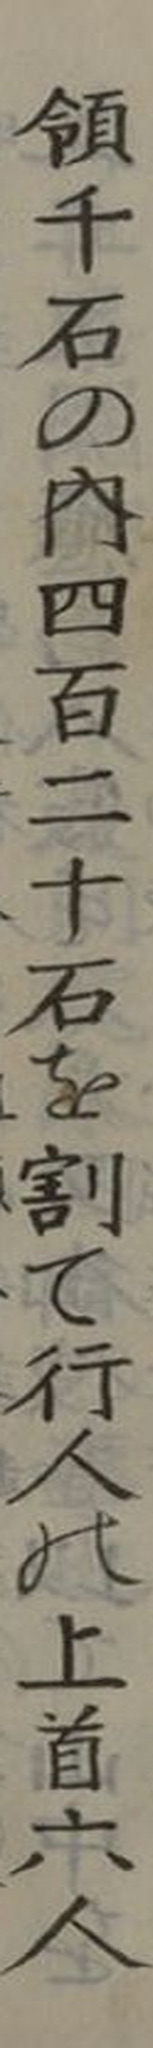領千石の內四百二十石を割て行人の上首六人
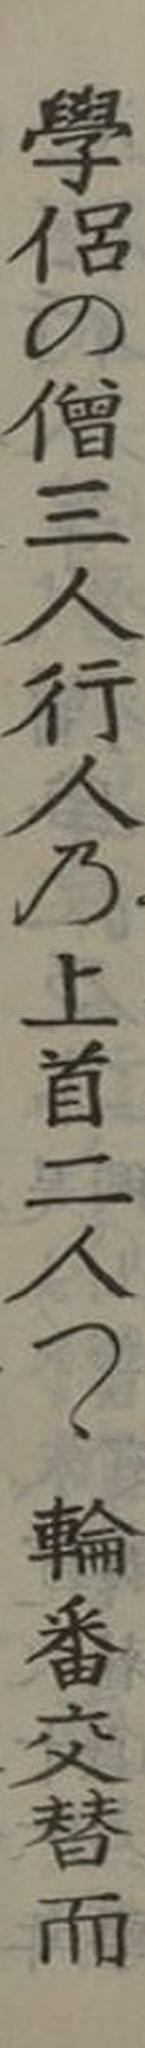學侶の僧三人行人の上首二人つゝ輪番交替而
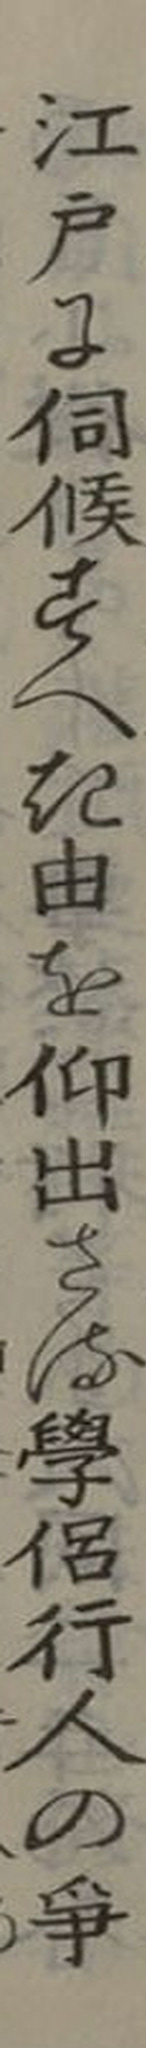江戸に伺候すへき由を仰出さる學侶行人の爭
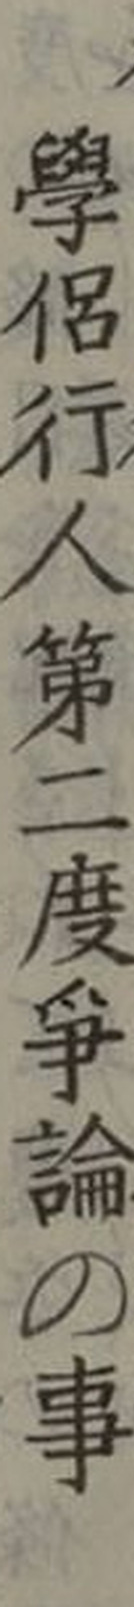學侶行人第二度爭論の事
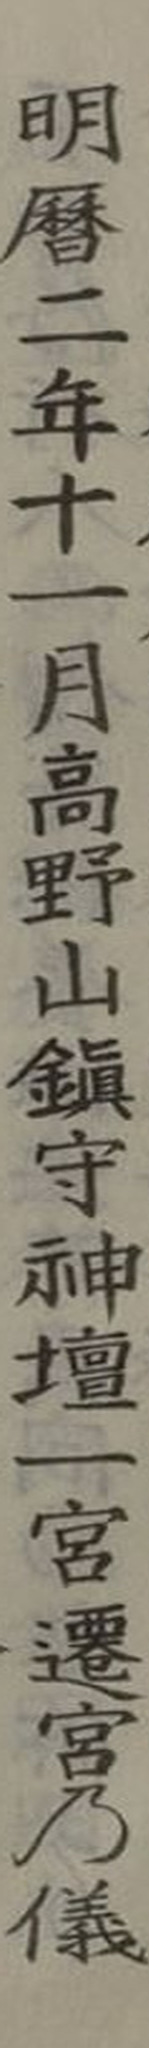明曆二年十一月高野山鎭守神壇一宮遷宮の儀
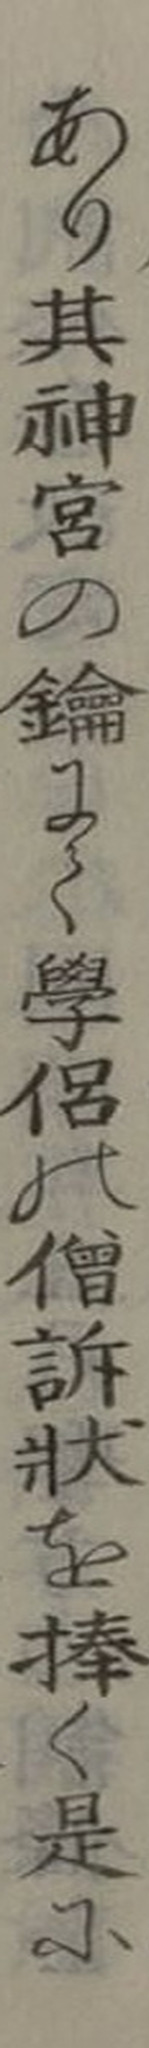あり其神宮の鑰にて學侶の僧訴狀を捧く是に
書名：骨董録
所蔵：University of the Ryukyus Library
